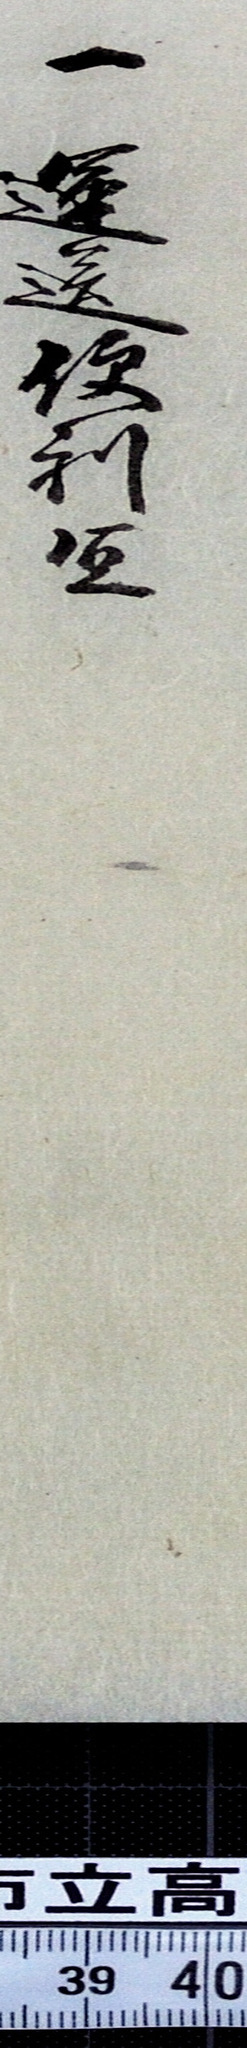一運送便利宜
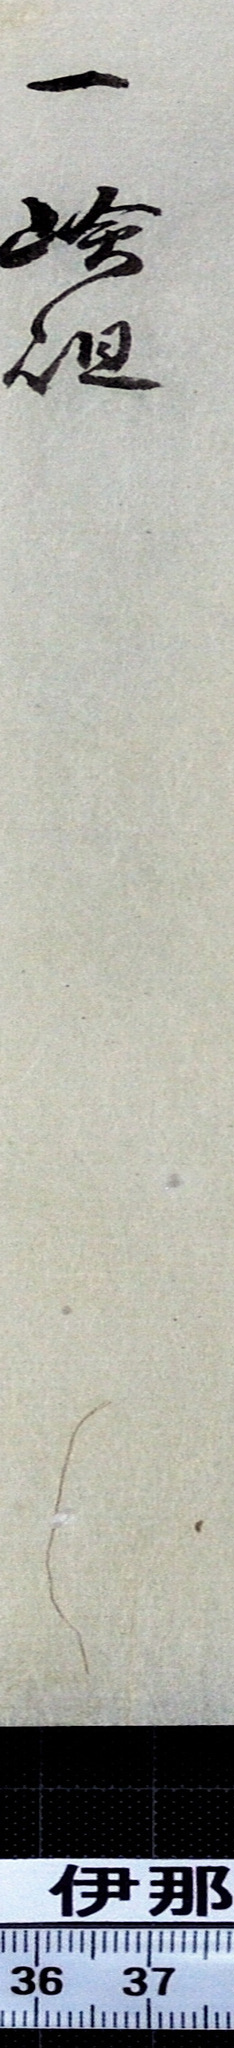一嶮岨

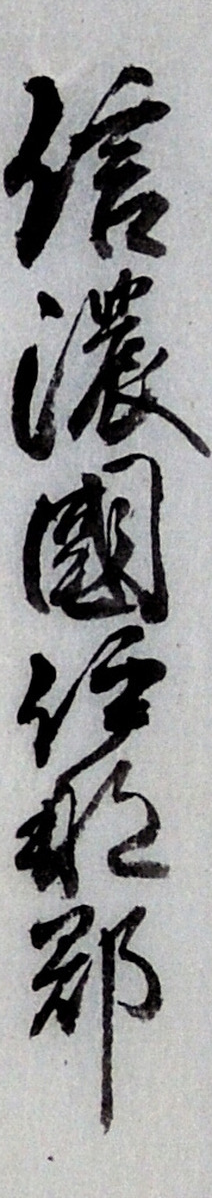信濃国伊那郡
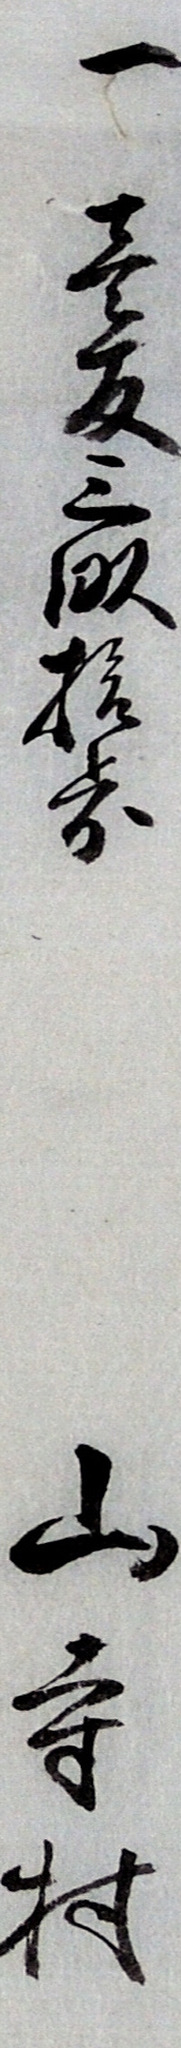一壱反三㽗拾歩山寺村
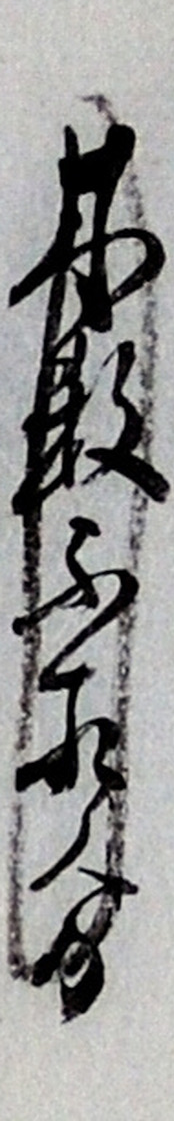木数不相分
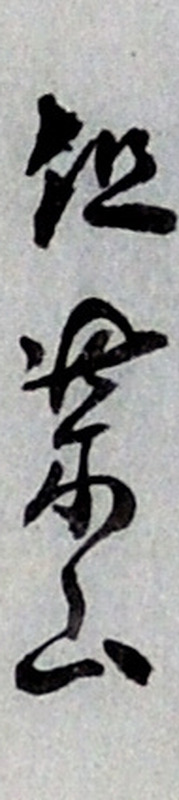但柴山
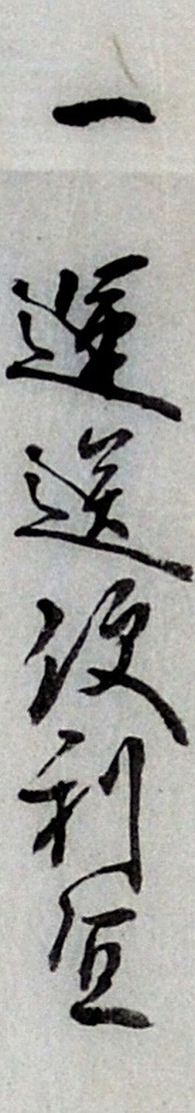一運送便利宜
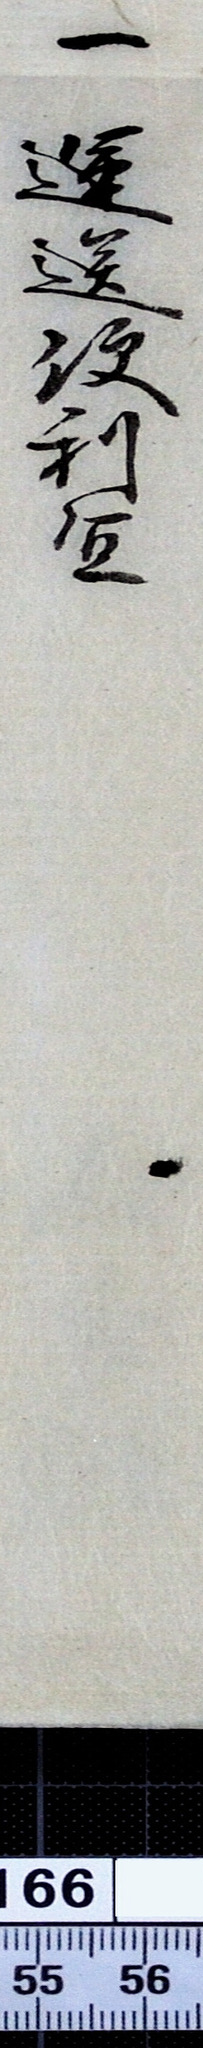一運送便利宜
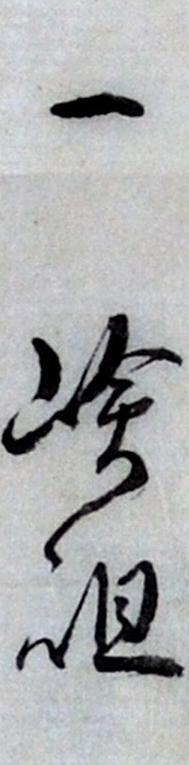一嶮岨
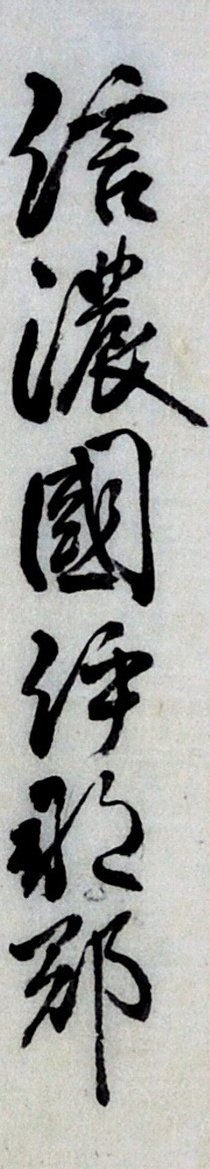信濃国伊那郡
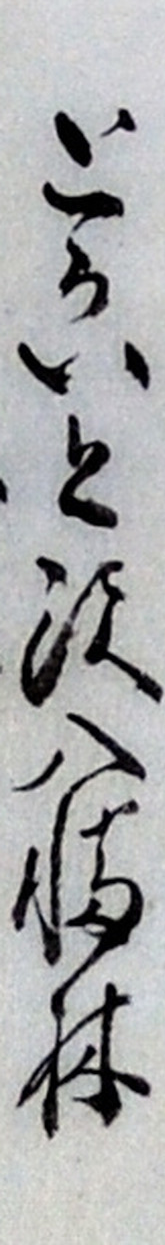とろいと沢八輌林
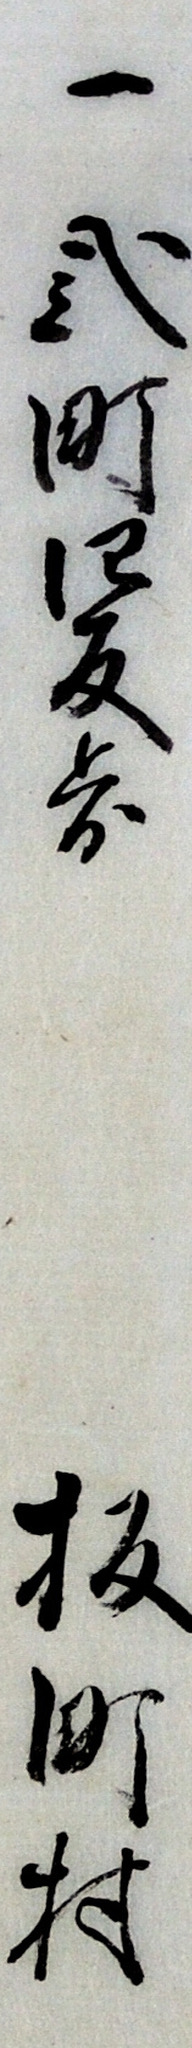一弐町四反歩板町村
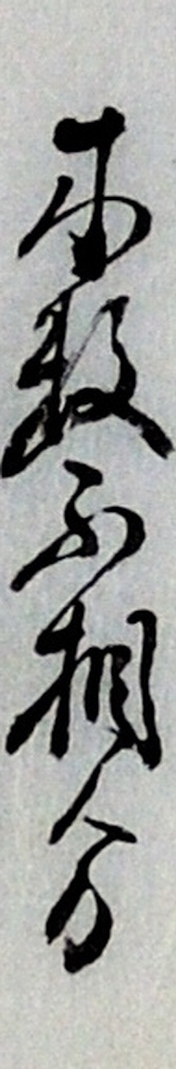木数不相分
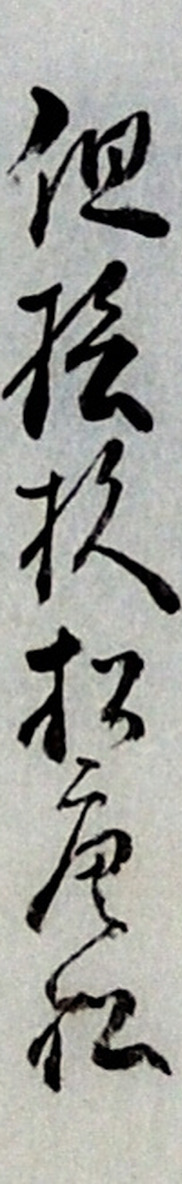但桧杦松唐松
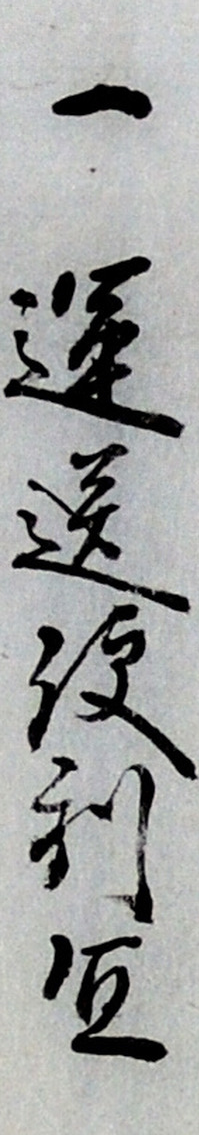一運送便利宜
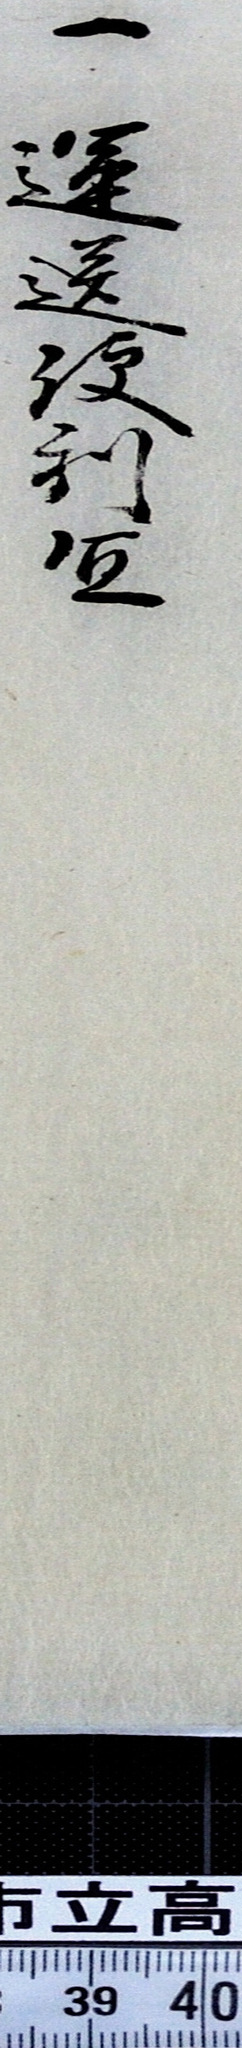一運送便利宜
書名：官林反別帳
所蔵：伊那市立高遠町図書館・合同会社AMANE
